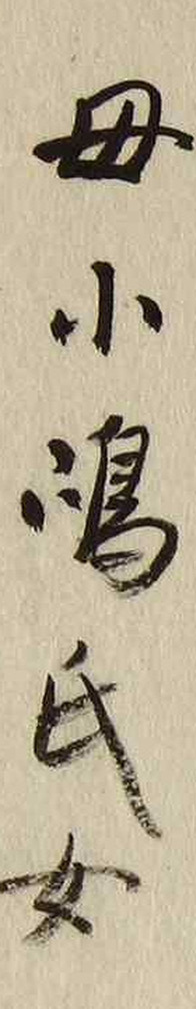母小島氏女

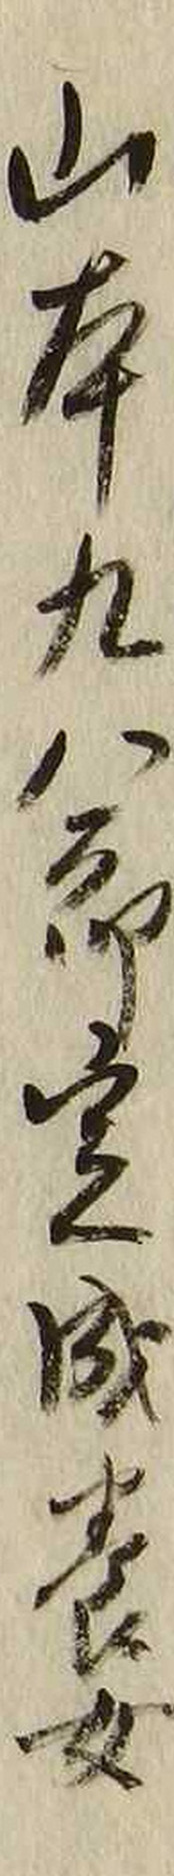山本九八郎定成養女
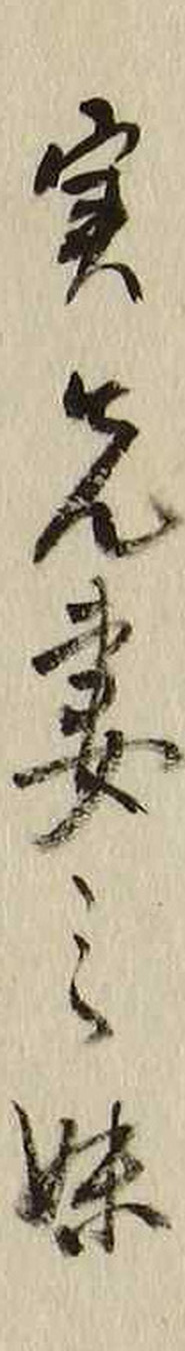実先妻之妹
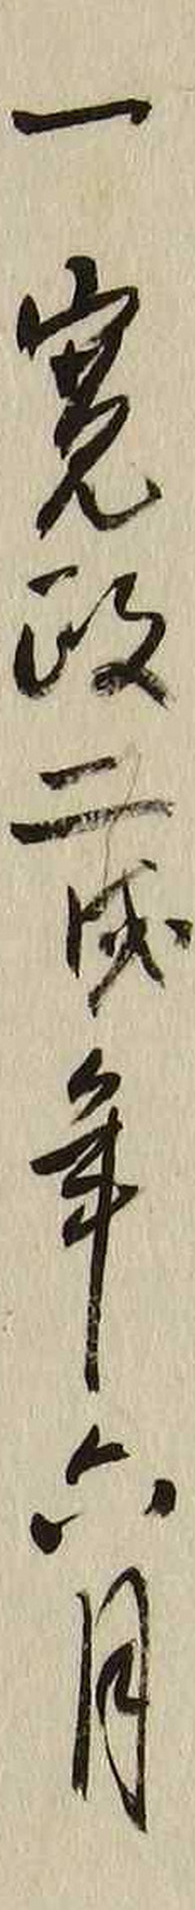一寛政二戌年六月
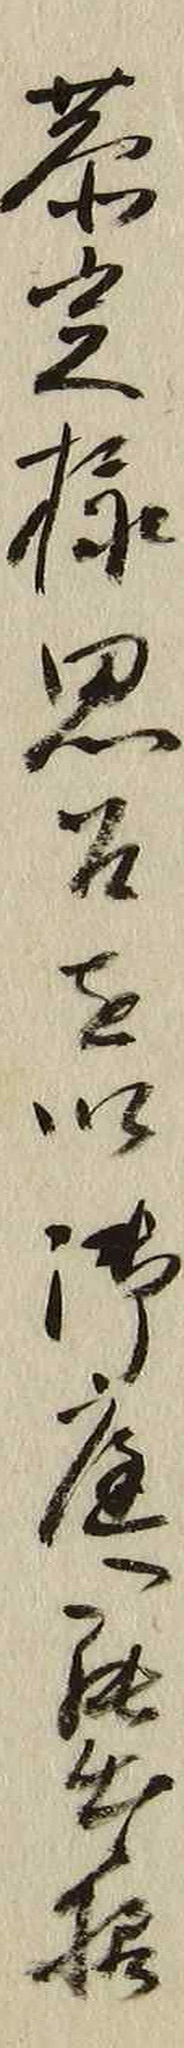恭定様思召を以御庭へ罷出候様
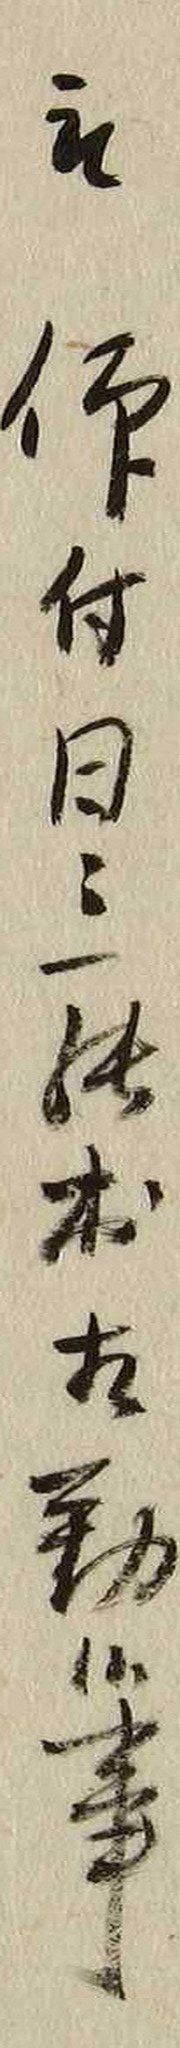被仰付日々罷出相勤候事
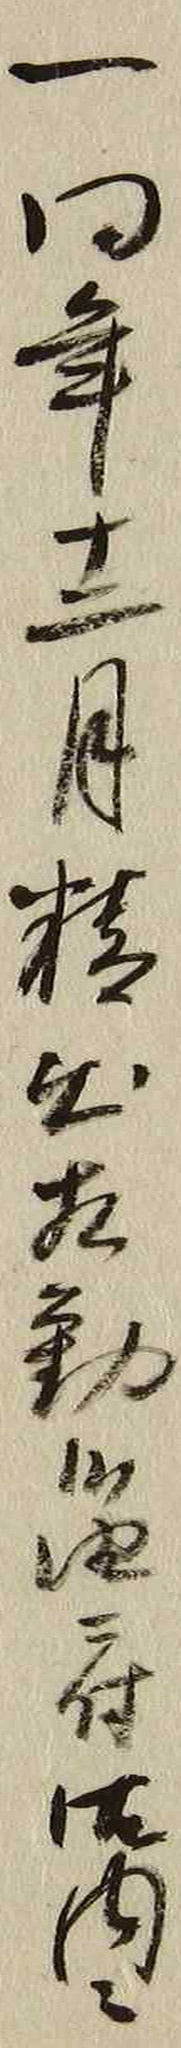一同年十二月精出相勤候由ニ付御内々
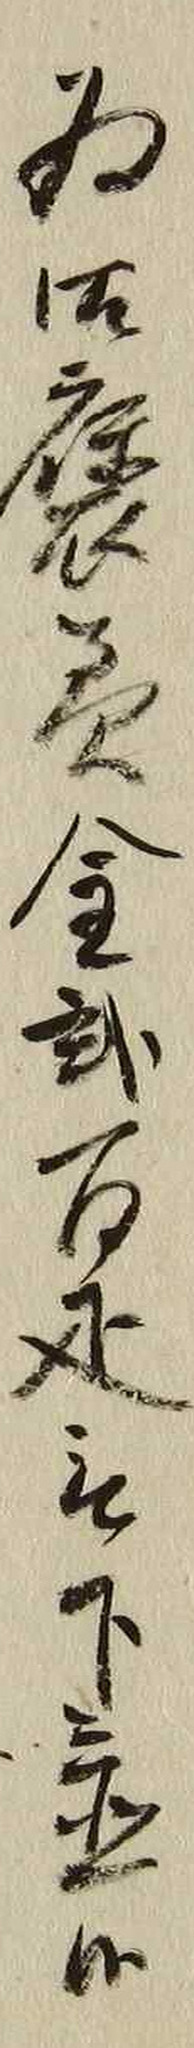為御褒美金弐百疋被下置候
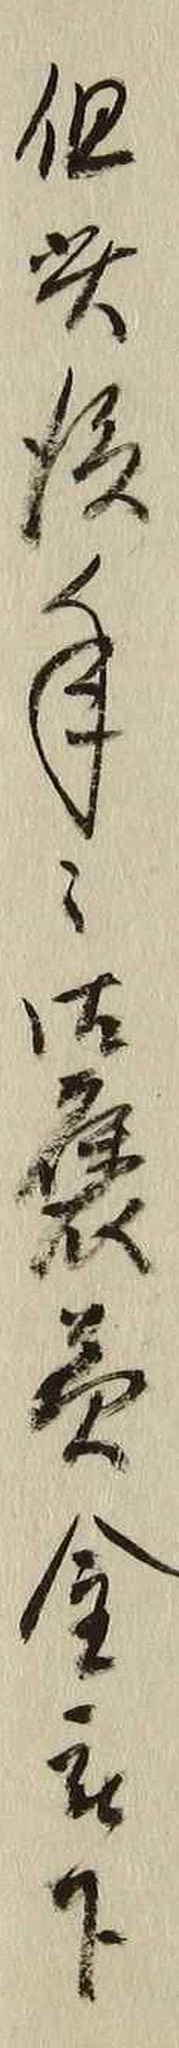但此後年々御褒美金被下
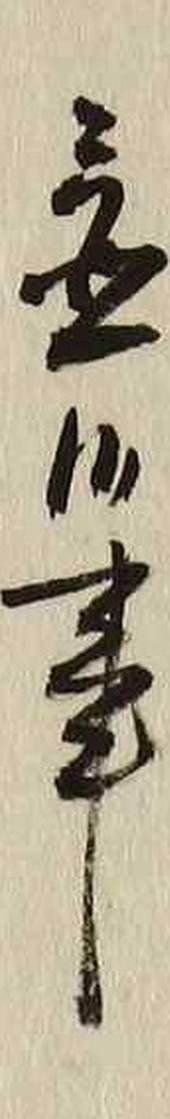置候事
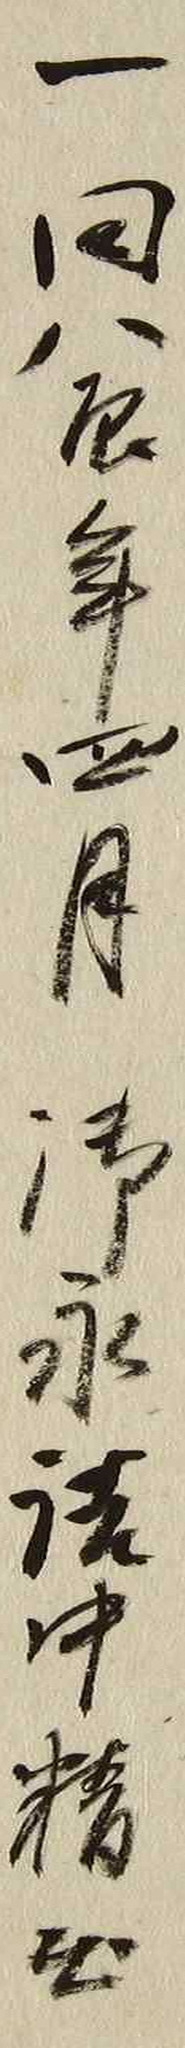一同八辰年四月御永詰中精出
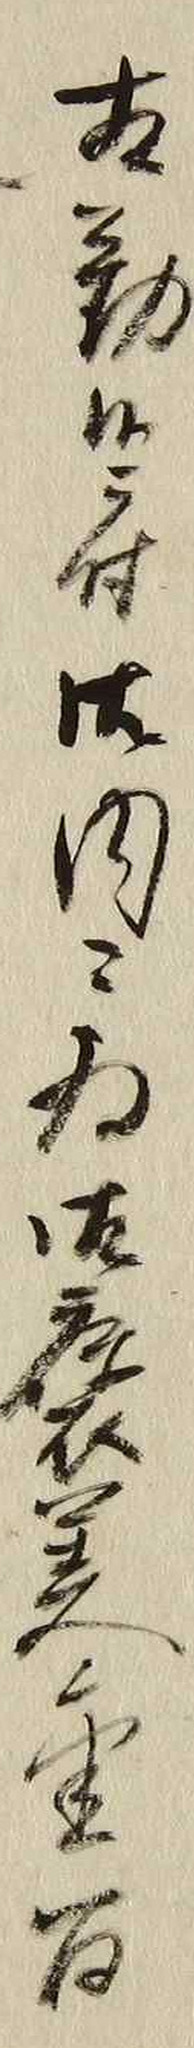相勤候ニ付御内々為御褒美金百
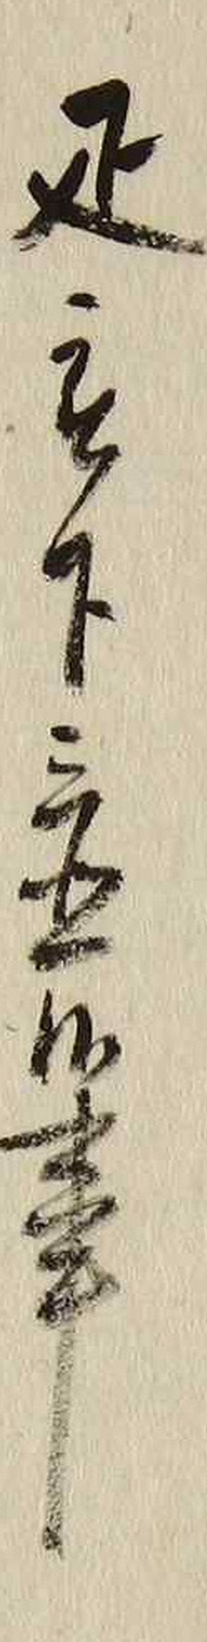疋被下置候事
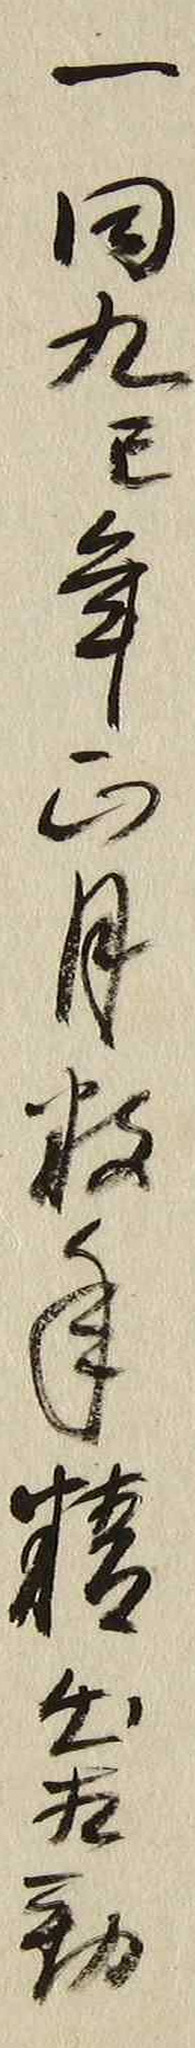一同九巳年正月数年精出相勤
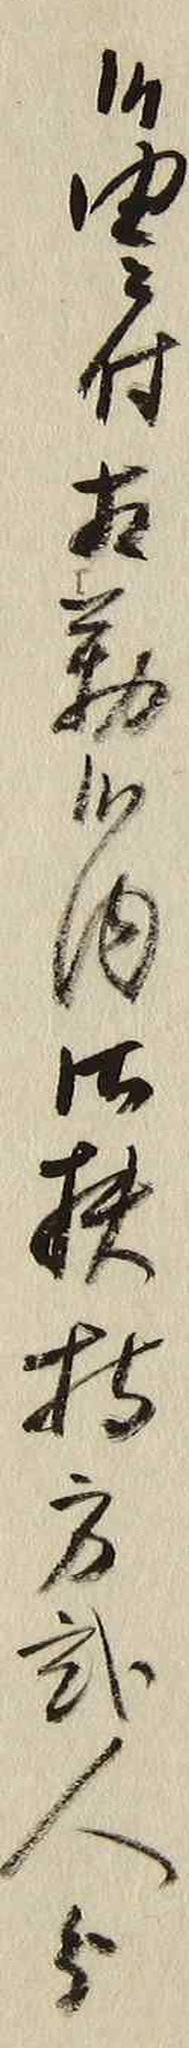候由ニ付相勤候内御扶持方弐人分
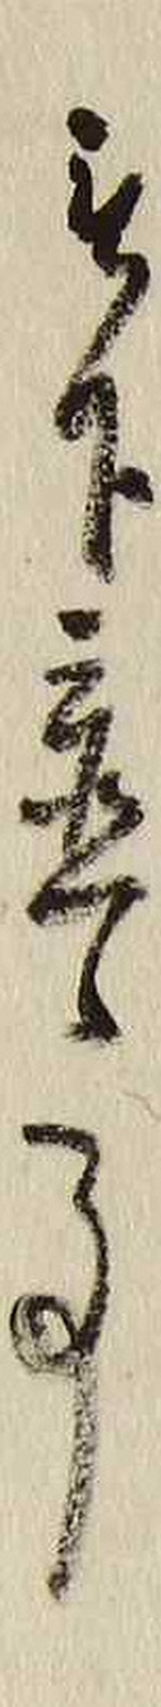被下置候事
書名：諸士系譜　巻之353　す之部3
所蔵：会津若松市立会津図書館
